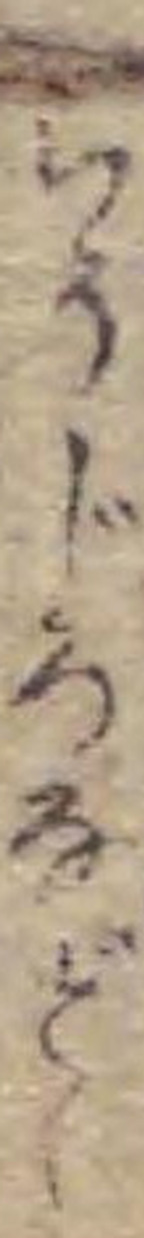らうじろなどゝ
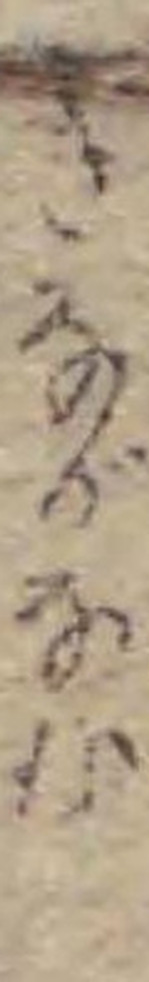きながなむ
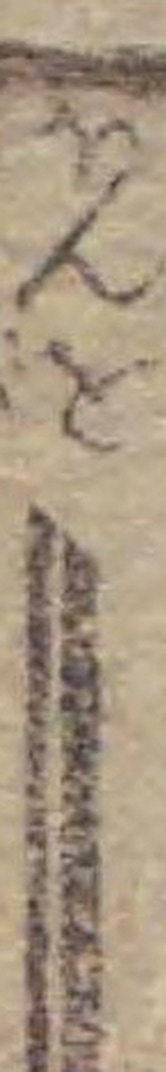ほんを
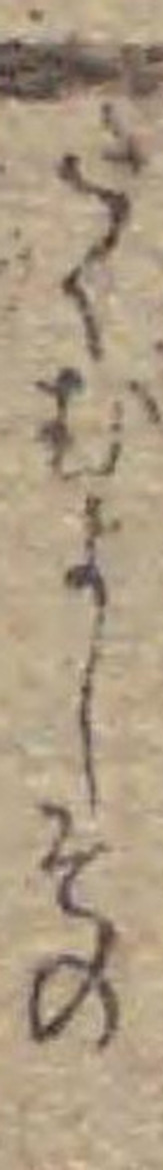たくむよしその
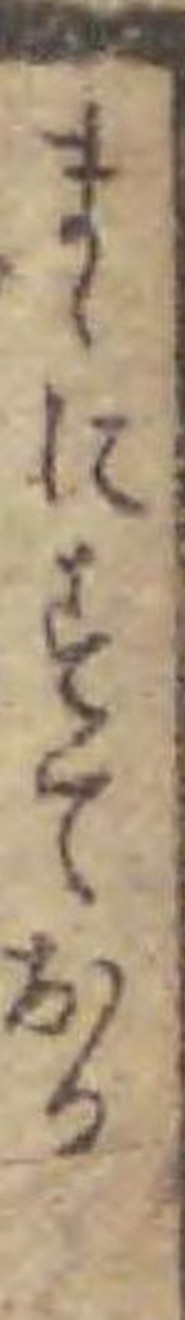まゝにすておか
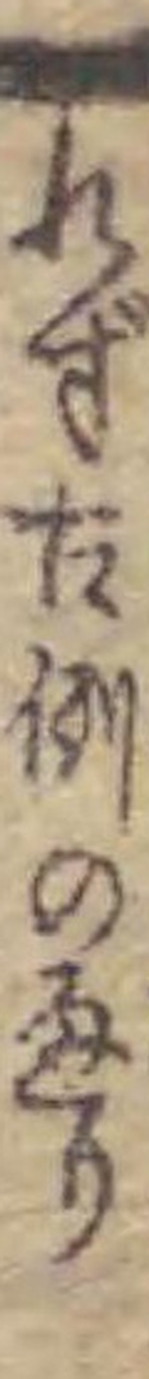れず古例の通り
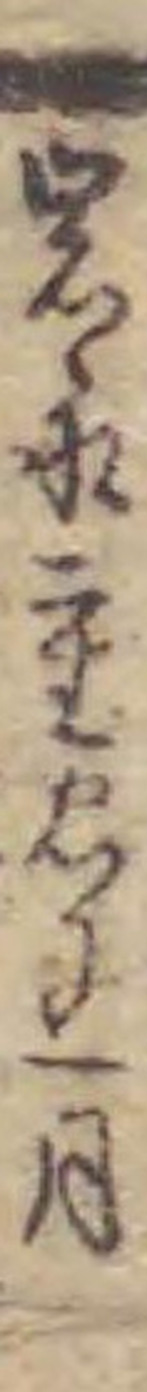岩永重忠に一月
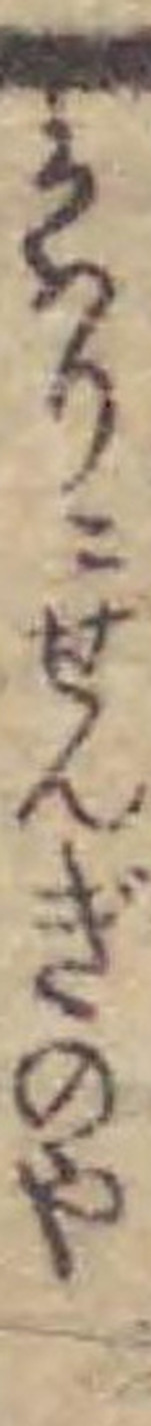かはりにせんぎのや
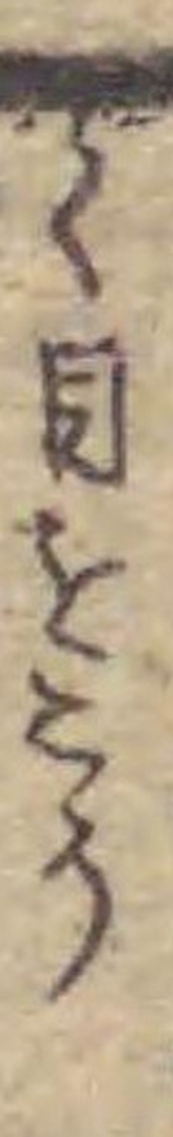く目をこう
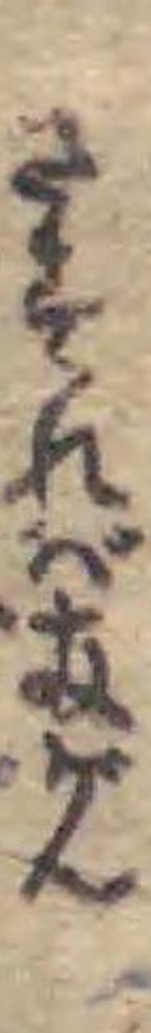さすれば両がん
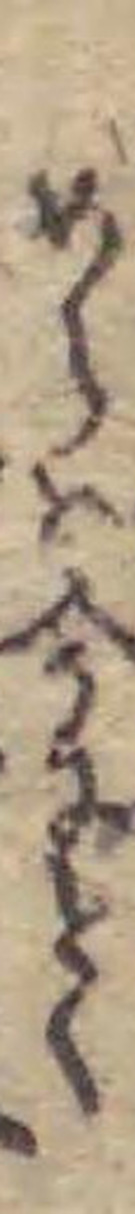めらは今にとく
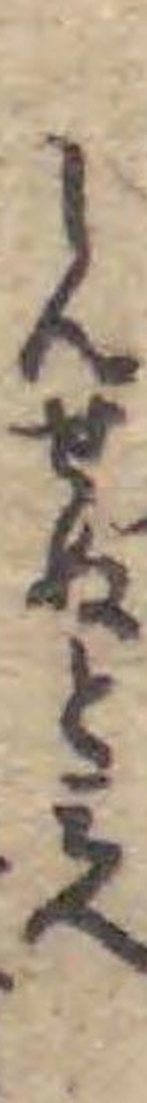しんせぬとみへ

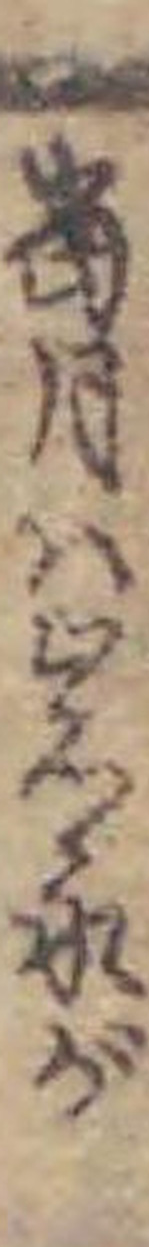当月は岩永が
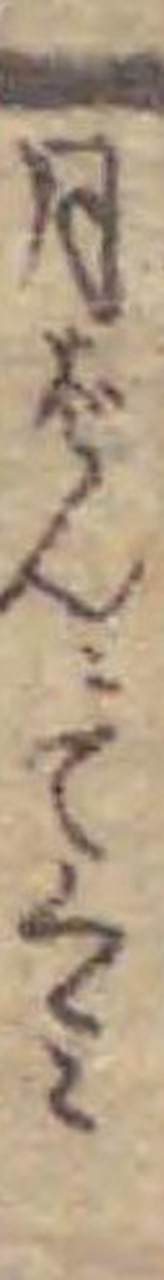月ばんにてくみ
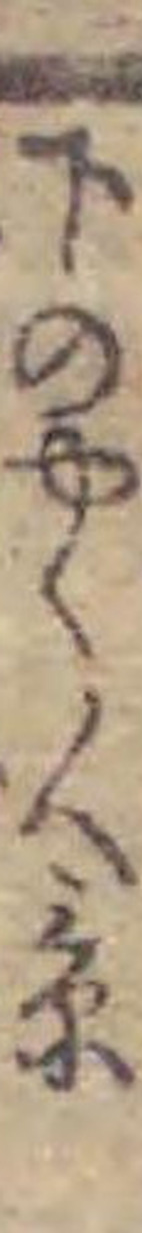下のやく人景
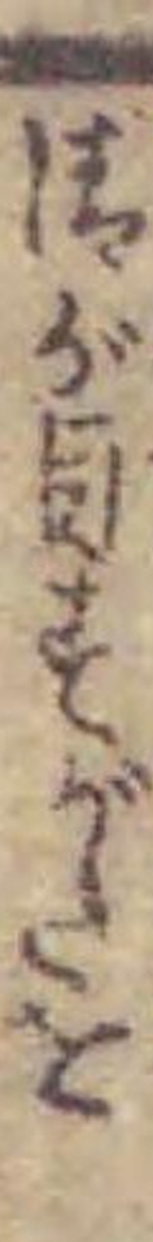清が目すがたを
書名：悪七変目景清 : 2巻
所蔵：国立国会図書館 National Diet Library, JAPAN
